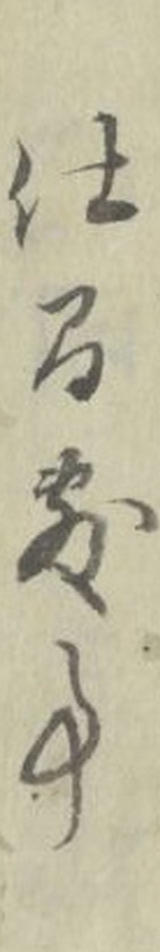仕間敷事

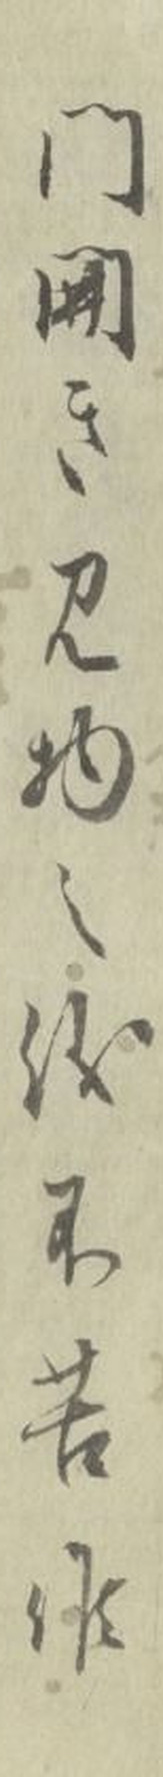一門開き見物之儀不苦候
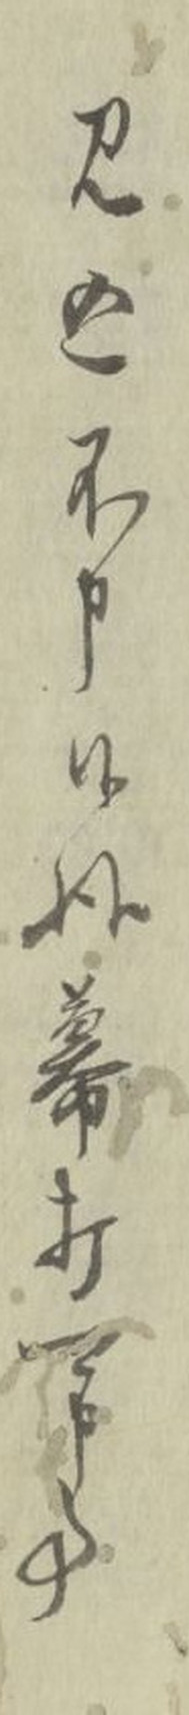見込不申候様幕打可申事
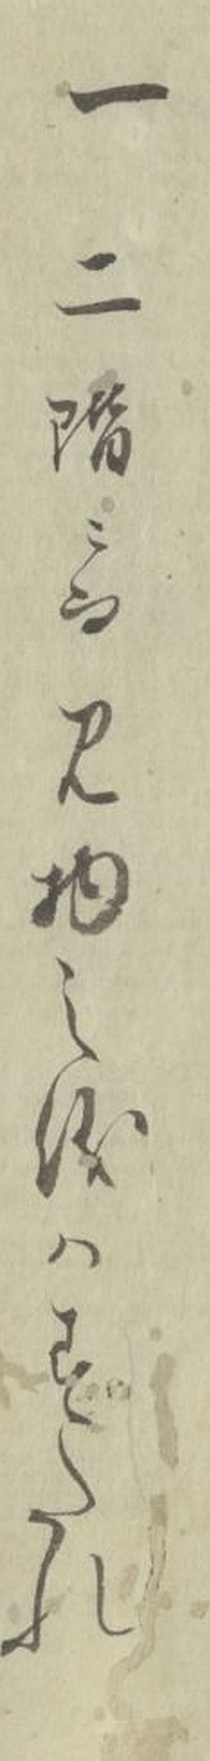一二階に而見物之儀はすたれ
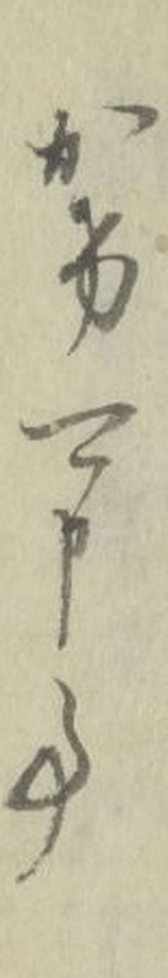かけ可申事
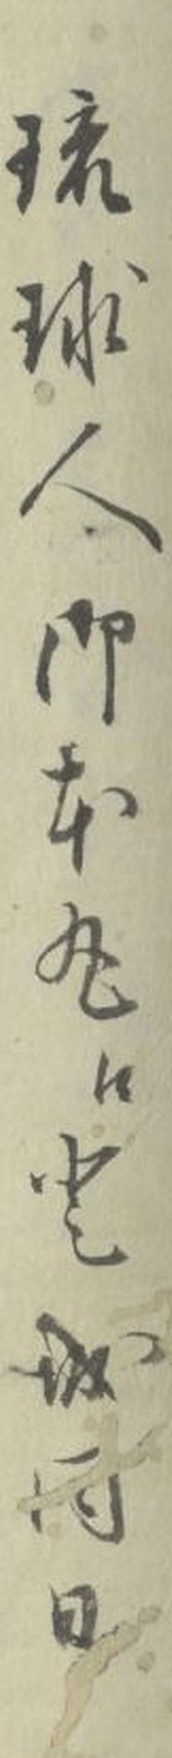琉球人御本丸え登城同日
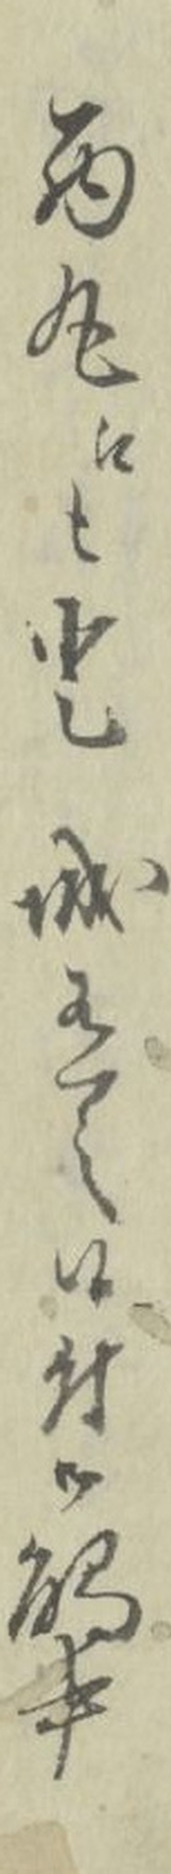西丸えも登城有之候付御触書
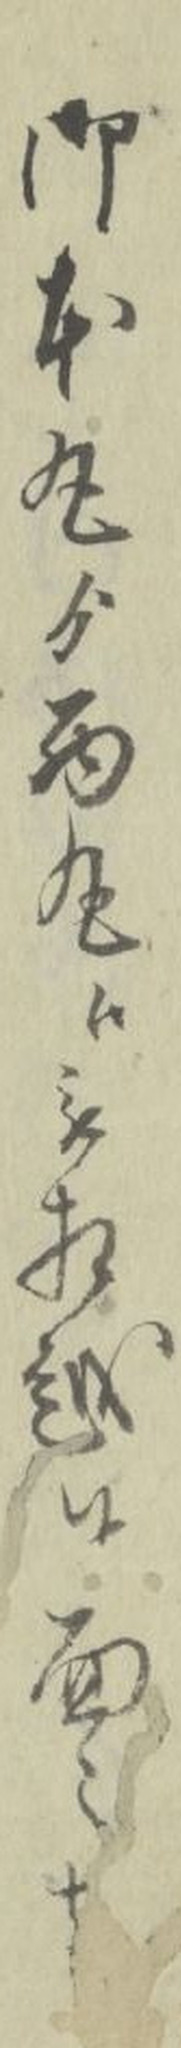御本丸ゟ西丸え被相越候面々は
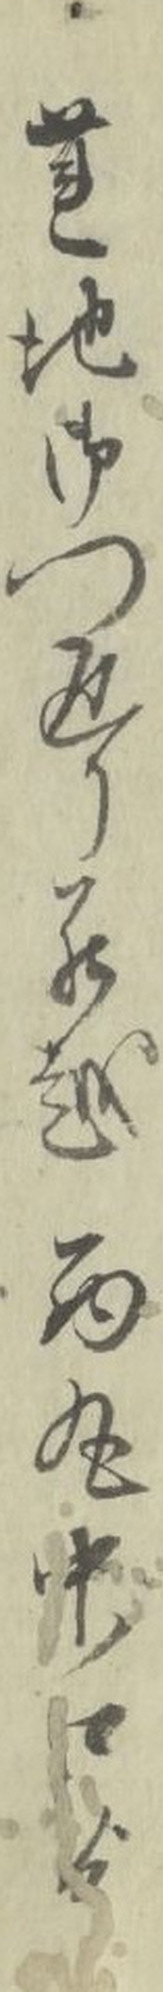蓮池御門通り罷越西丸中の口ゟ
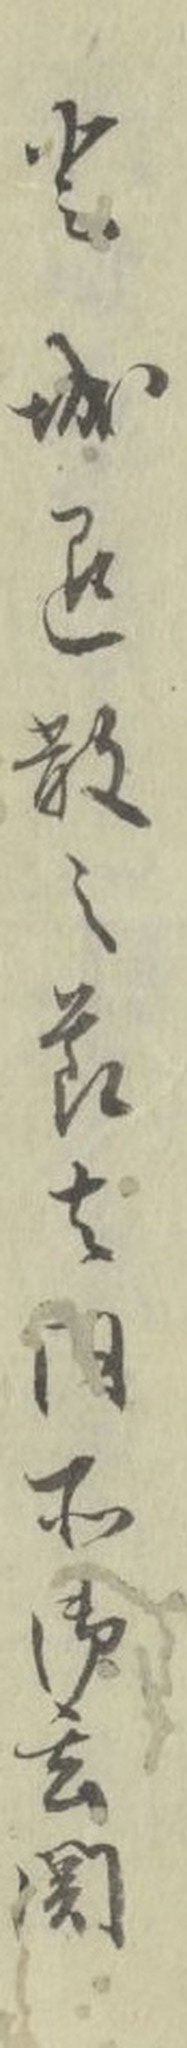登城退散之節は同所御玄関
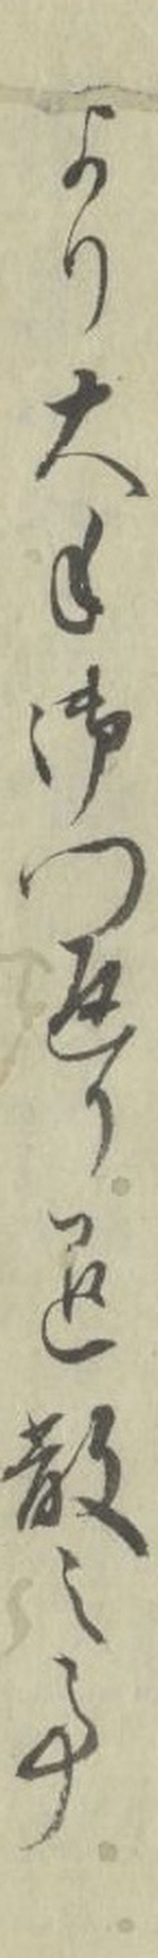より大手御門通り退散之事

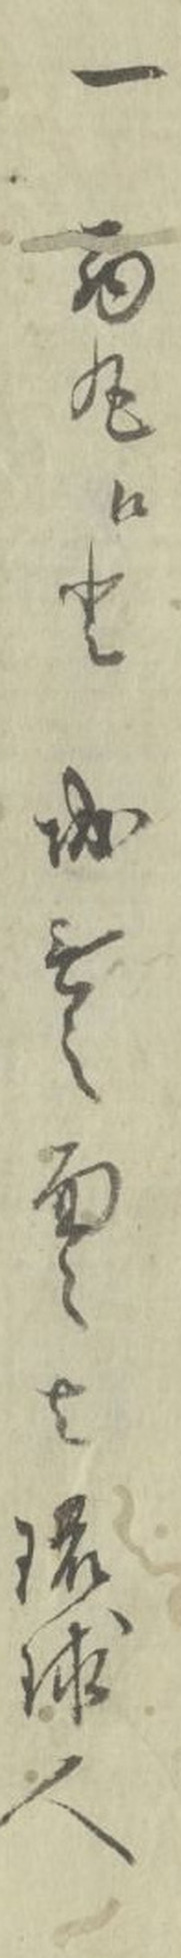一西丸え登城無之面々は琉球人
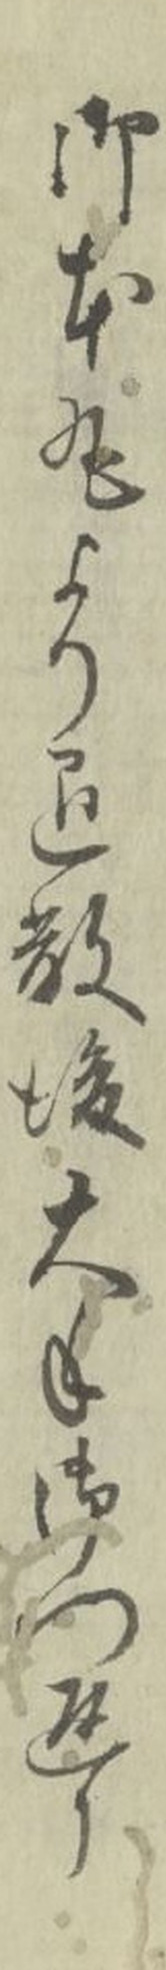御本丸より退散後大手御門通り
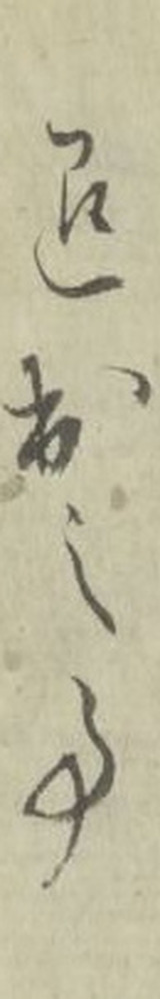退出之事
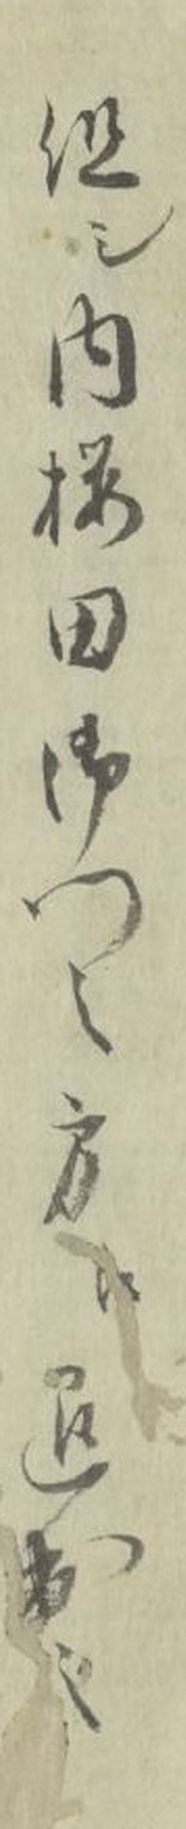但し内桜田御門之方え退出之
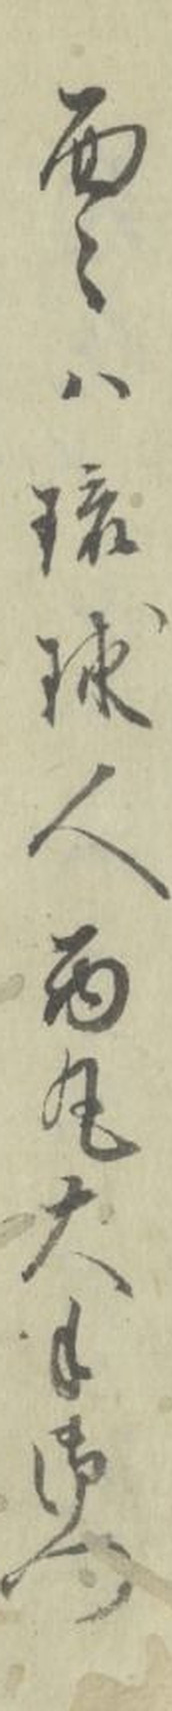面々は琉球人西丸大手御門
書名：琉球来朝記 自一至七
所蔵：University of the Ryukyus Library
